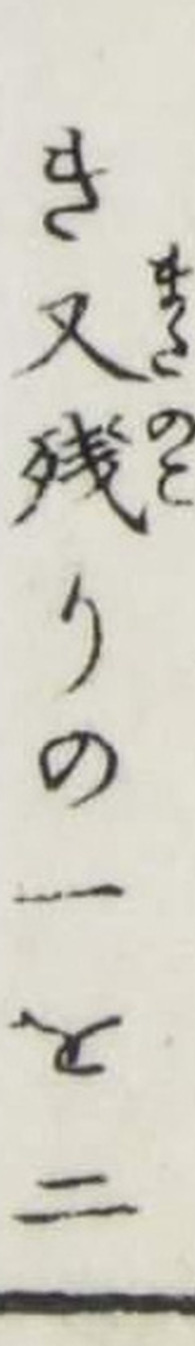き又残り一を二
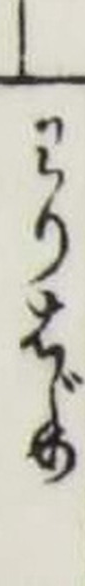わりはじめ
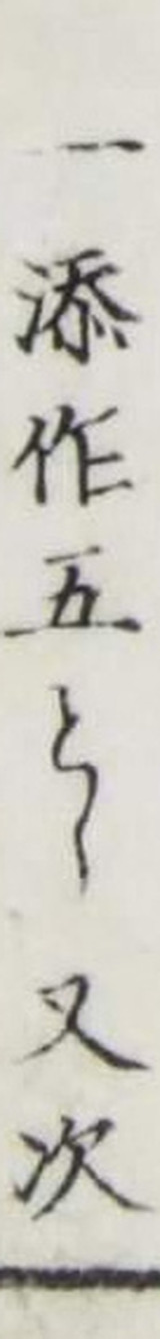一添作五とし又次
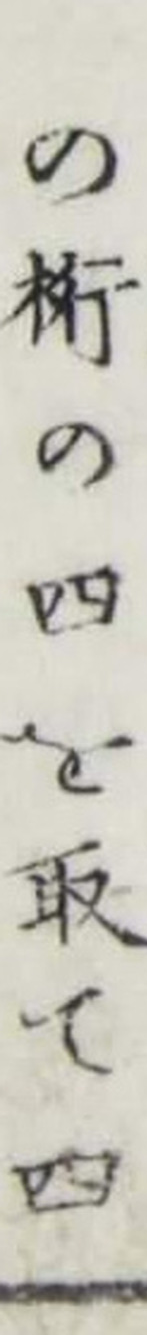の桁の四を取て四
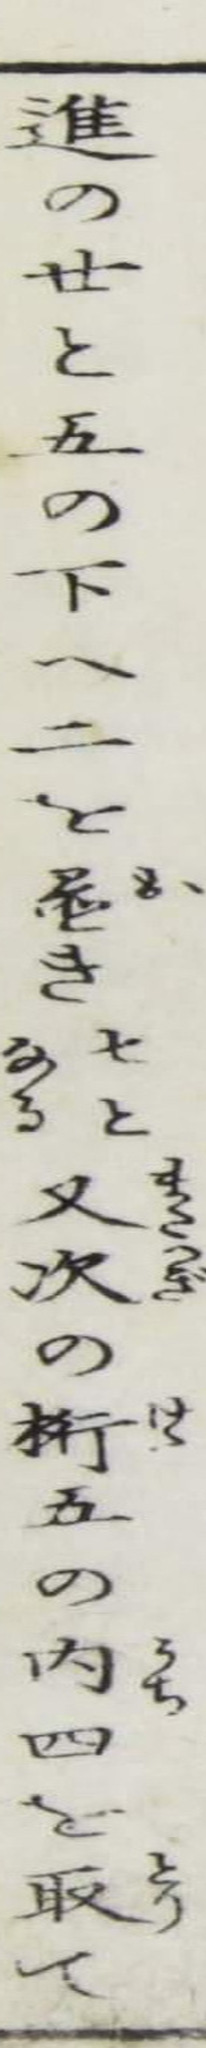進の廿と五の下へ二を置き七となる又次の桁五の内四を取て
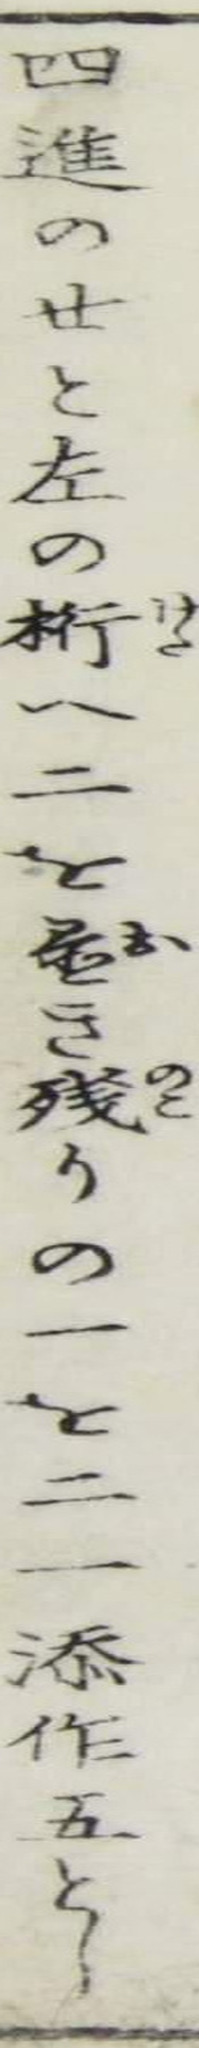四進の廿と左の桁へ二を置き残りの一を二一添作五とし

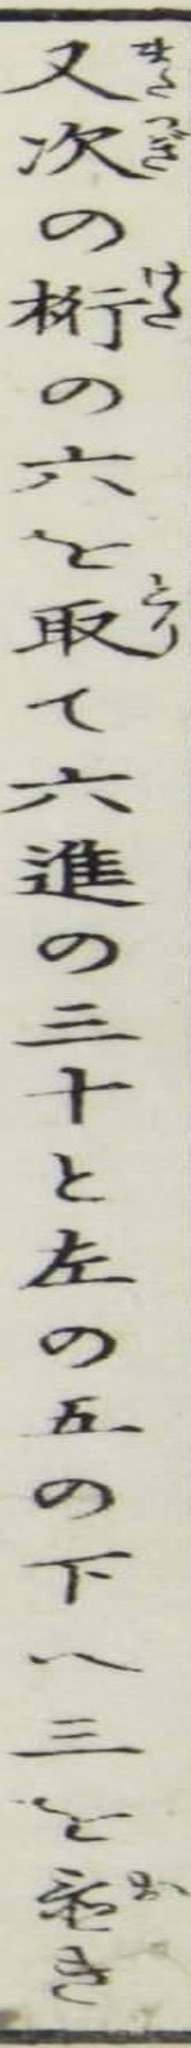又次の桁の六を取て六進の三十と左の五の下へ三を置き
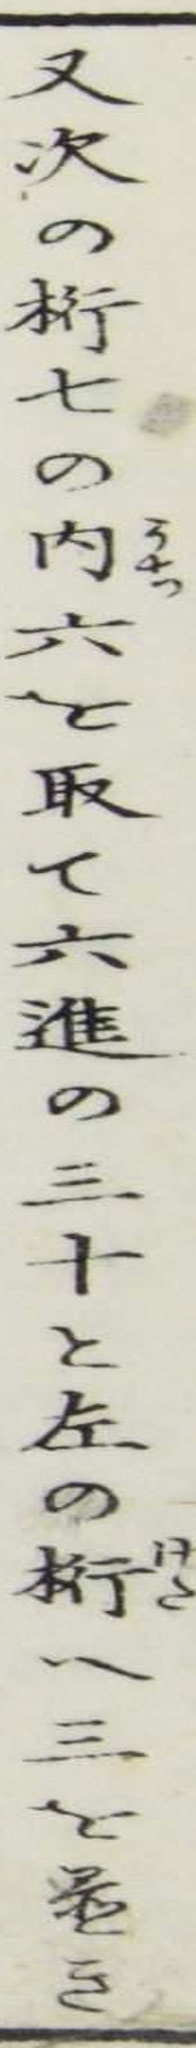又次の桁七の内六を取て六進の三十と左の桁へ三を置き
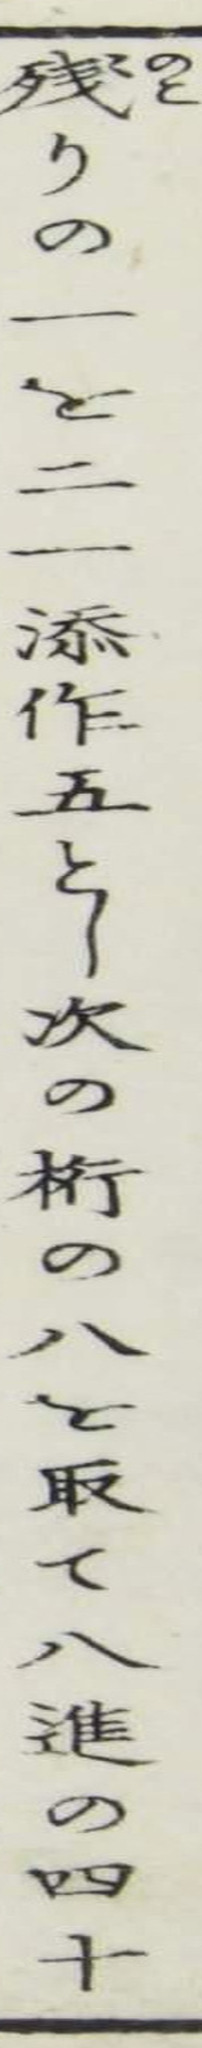残りの一を二一添作五とし次の桁の八を取て八進の四十
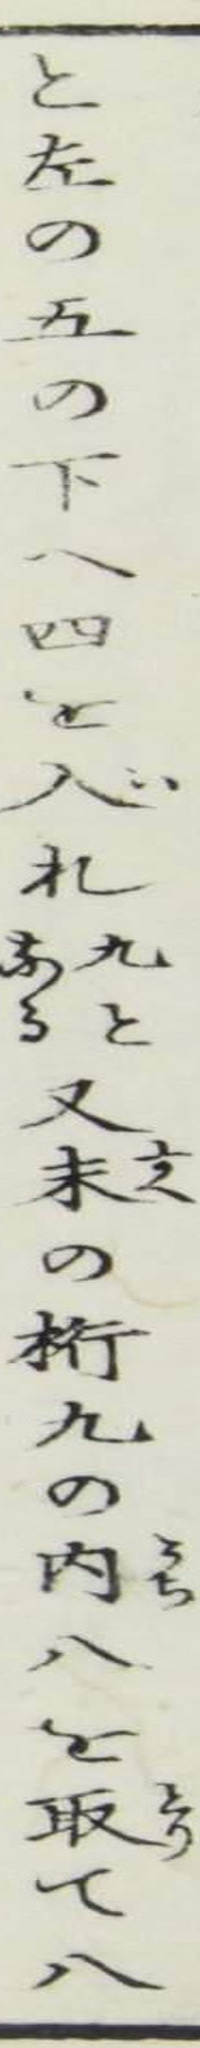と左の五の下へ四を入れ九となる又末の桁九の内八を取て八
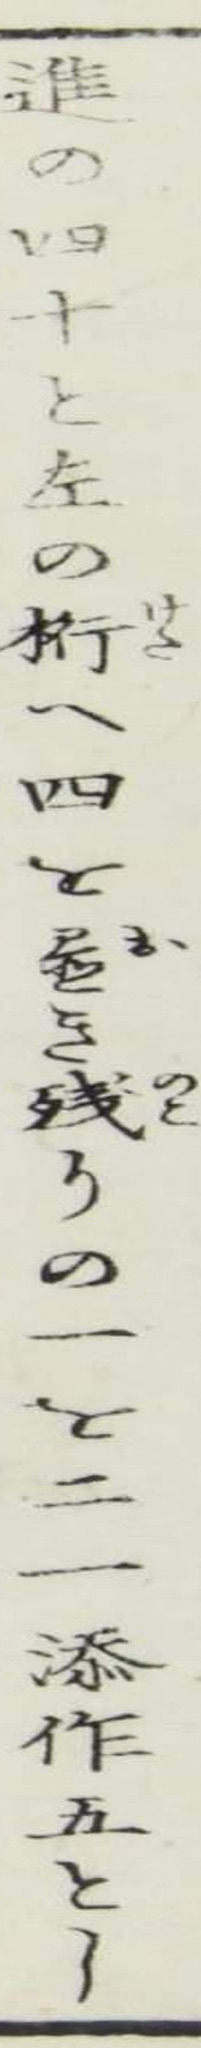進の四十と左の桁へ四を置き残りの一を二一添作五とし
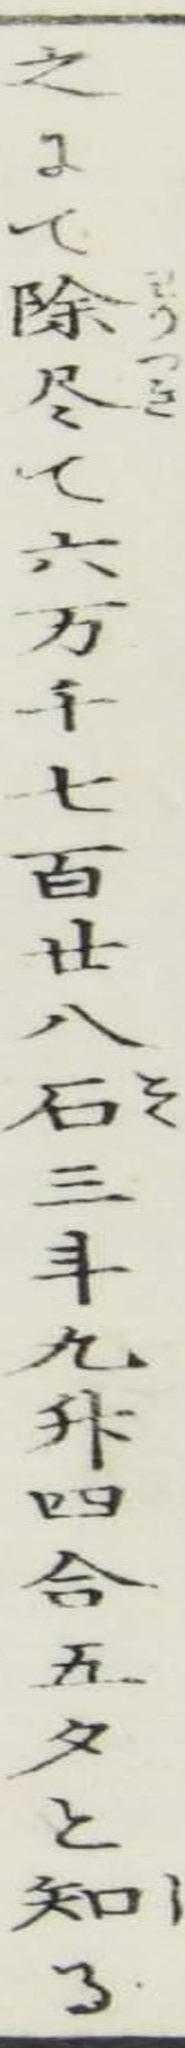之にて除尽て六万千七百廿八石三斗九升四合五勺と知る
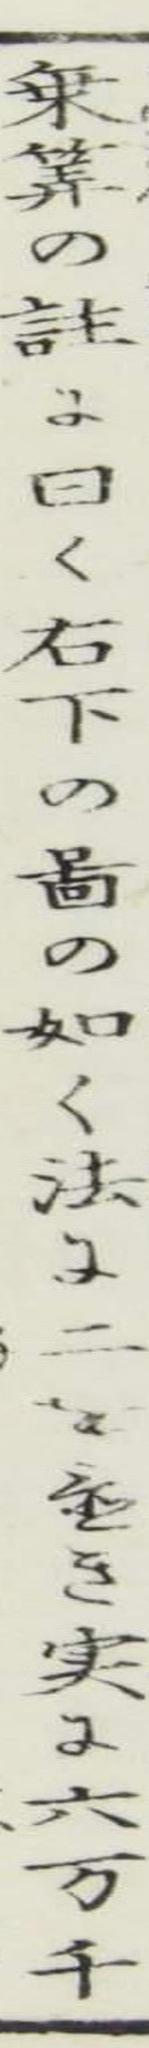乗算の註に曰く右下の図の如く法に二を置き実に六万千
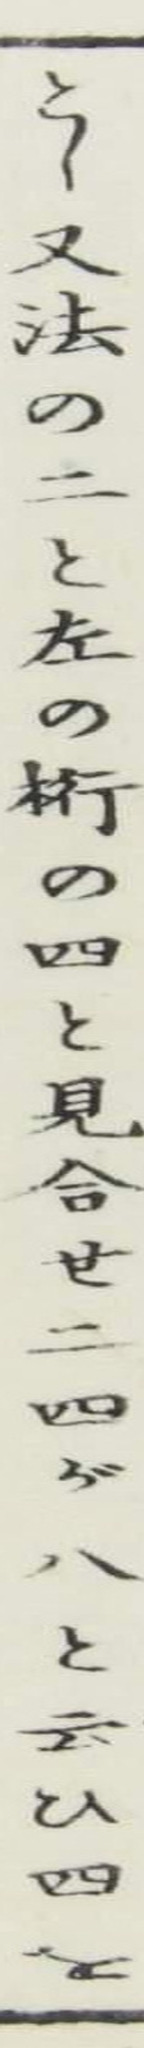とし又法の二と左の桁の四と見合せ二四が八と云ひ四を
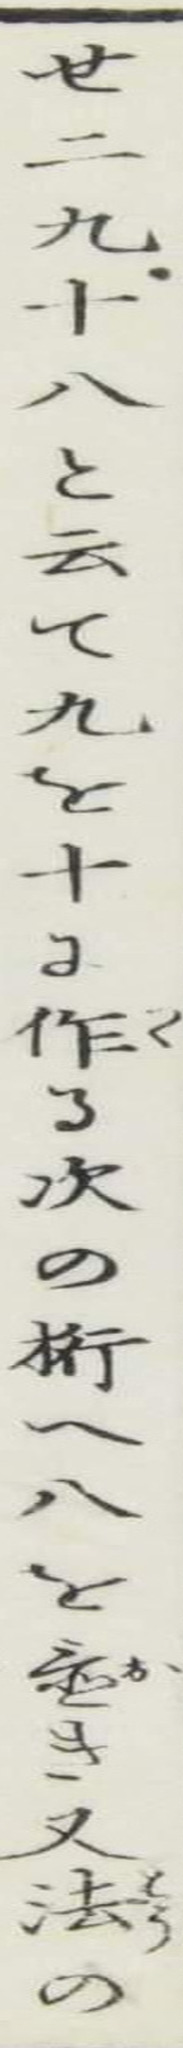せニ九．十八と云て九を十に作る次の桁へ八を置き又法の
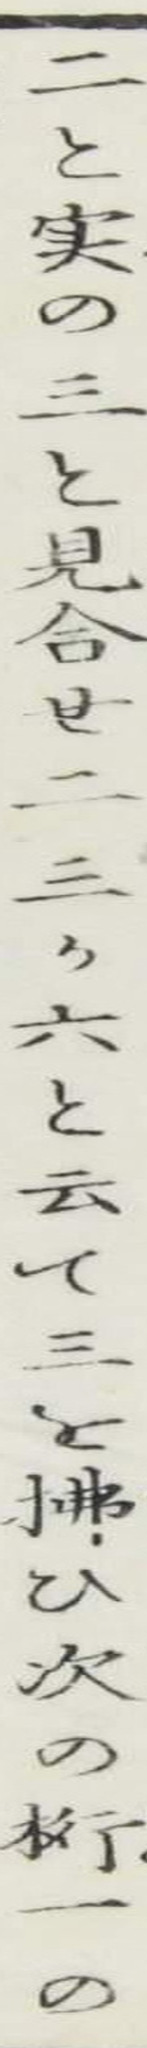二と実の三と見合せ二三か六と云て三を払ひ次の桁一の
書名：明治小學塵劫記 卷1
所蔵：東京学芸大学教育コンテンツアーカイブ
